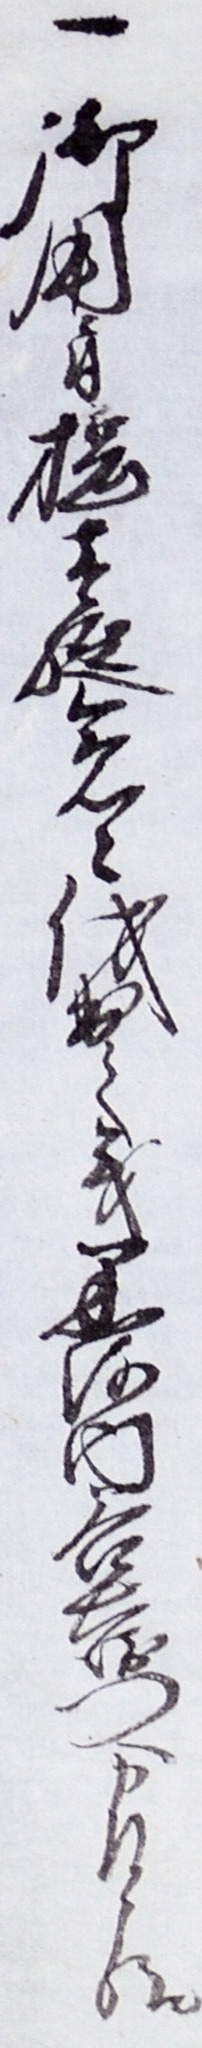一御用ニ付椹壱挺急々伐出之義黒河内善右衛門へ申付候様
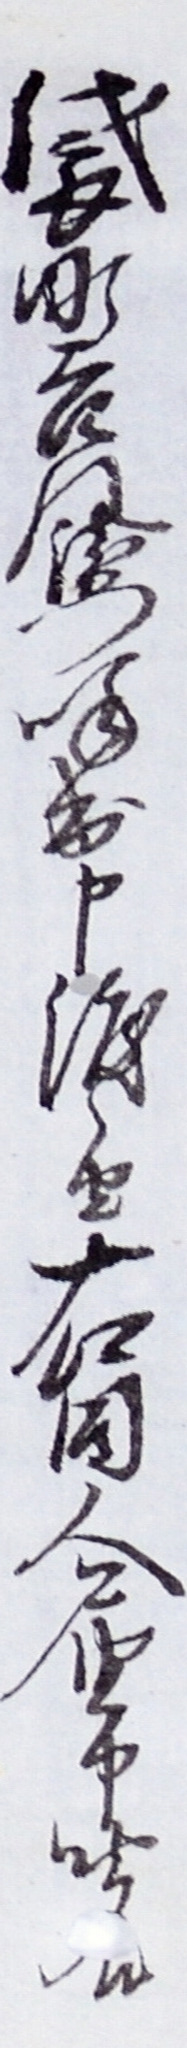袋町吉左衛門呼出申渡候由右同人届申聞候
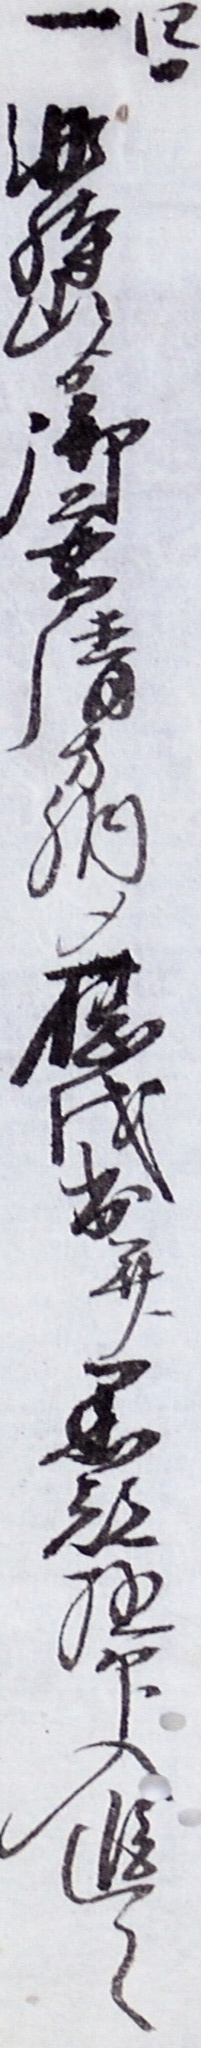一非持山より御普請方納〆椹伐出并黒部極印入追々
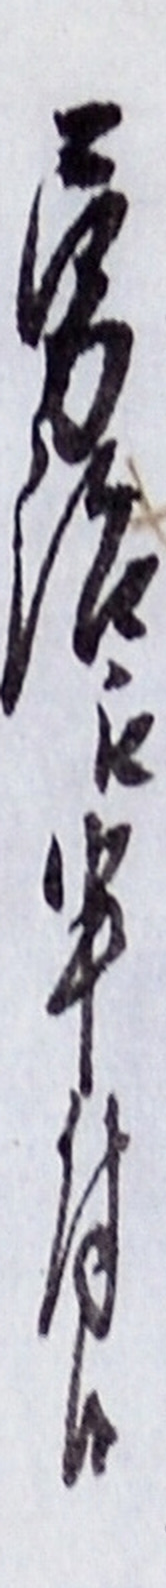勇治江申付候
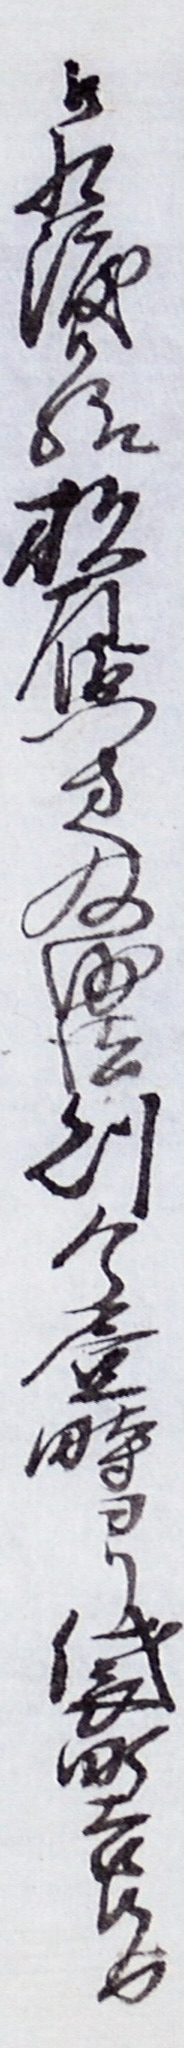被相渡候様杉左衛門ヘ及沙汰則今昼時ヨリ袋町吉左衛門
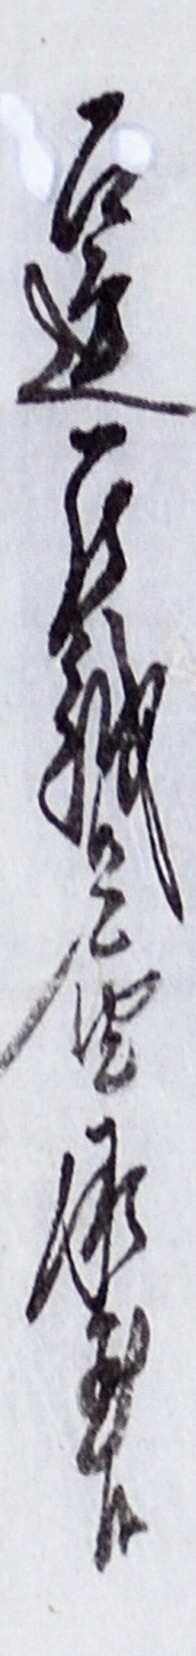召連罷越候届承置候
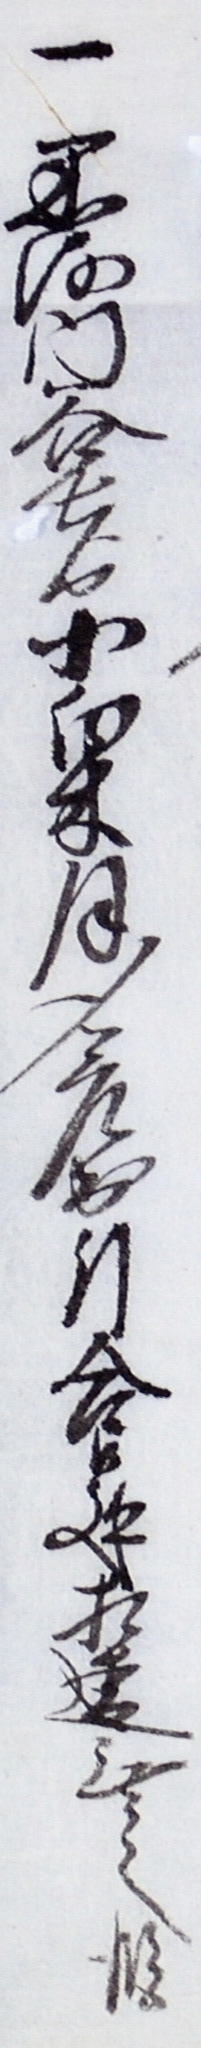一黒河内善右衛門小白木月〆差出引合候処相違無之段
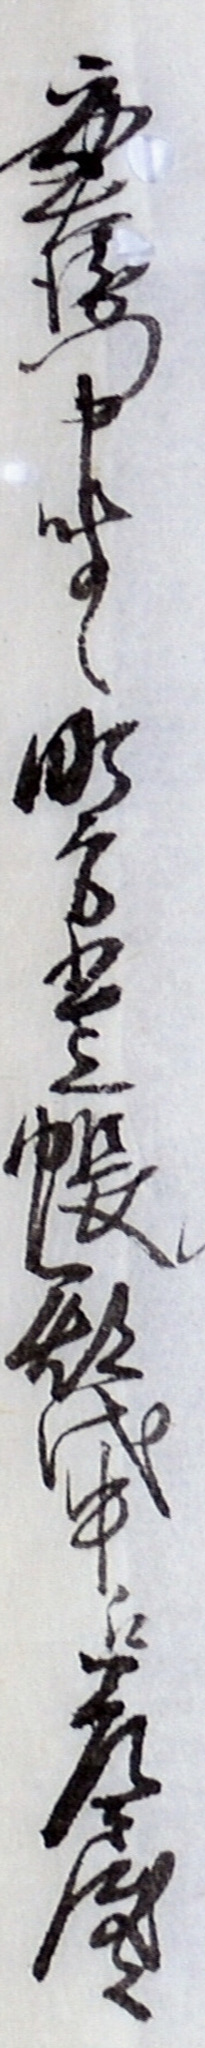安右衛門申聞候町方書上帳郡代中江差渡候
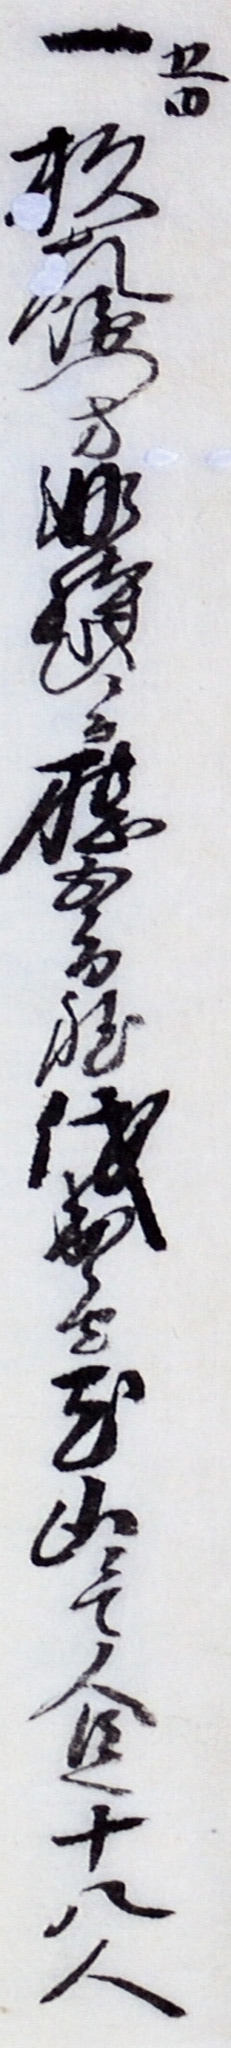一杉左衛門方非持山ニ而椹五百程伐出候由尤山ニて人足十八人
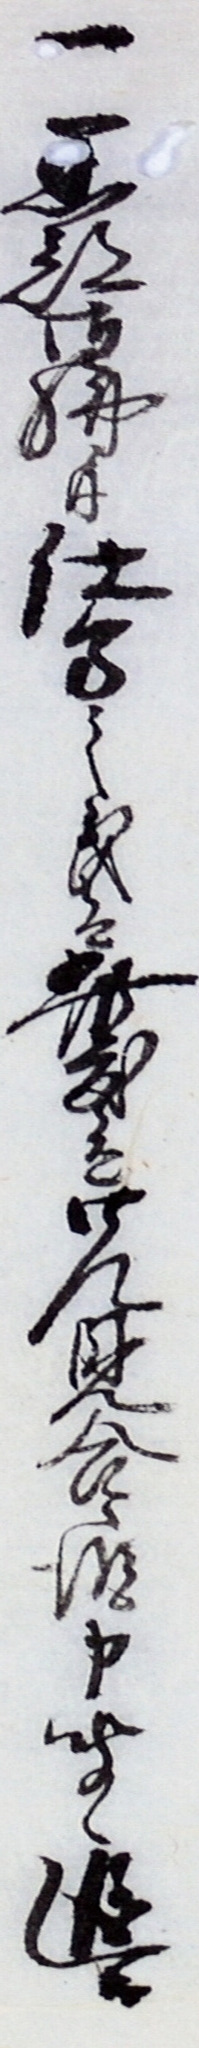一黒部御払用ニ付仕分之義は此度は先見合候段申聞候追而
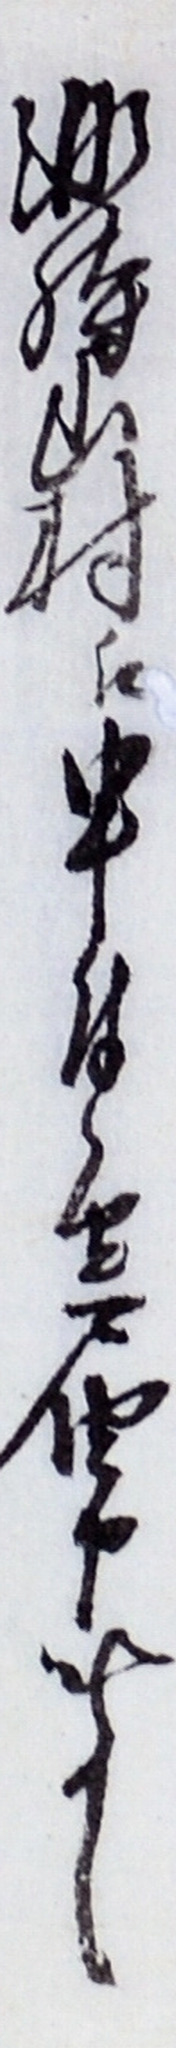非持山村江申付候由届申聞候
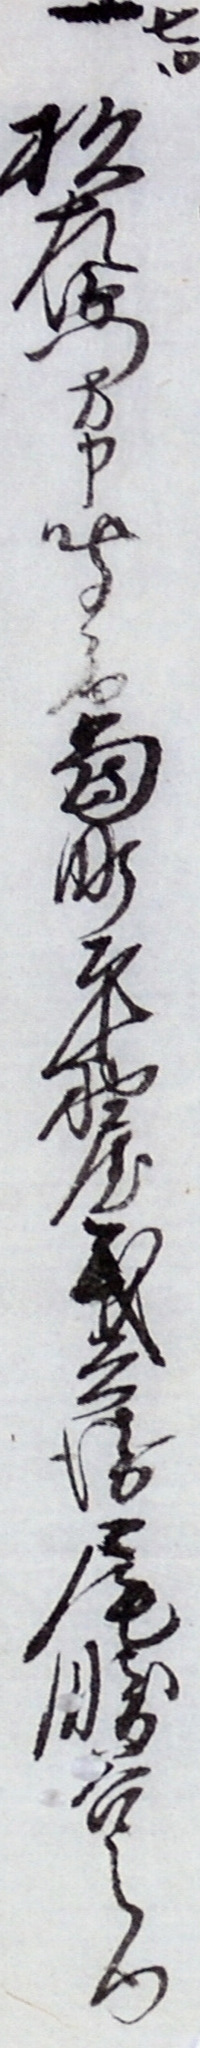一杉左衛門方申聞候由当町平野屋儀兵衛尾勝谷之内
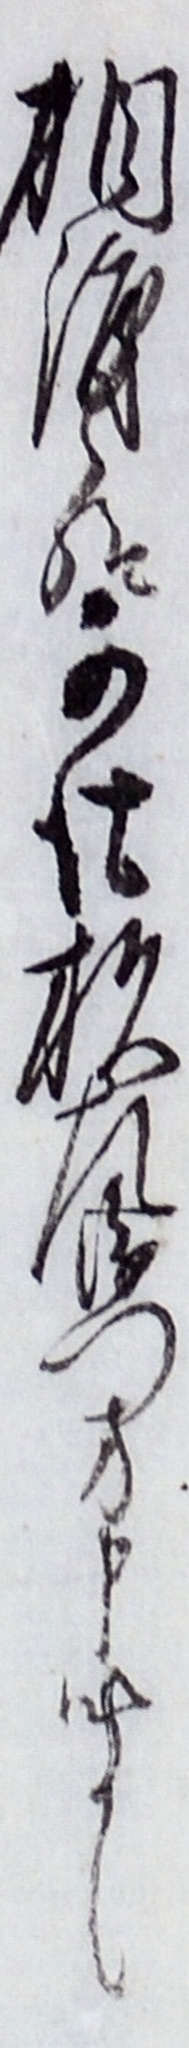相渡候様可仕杉左衛門方申聞候
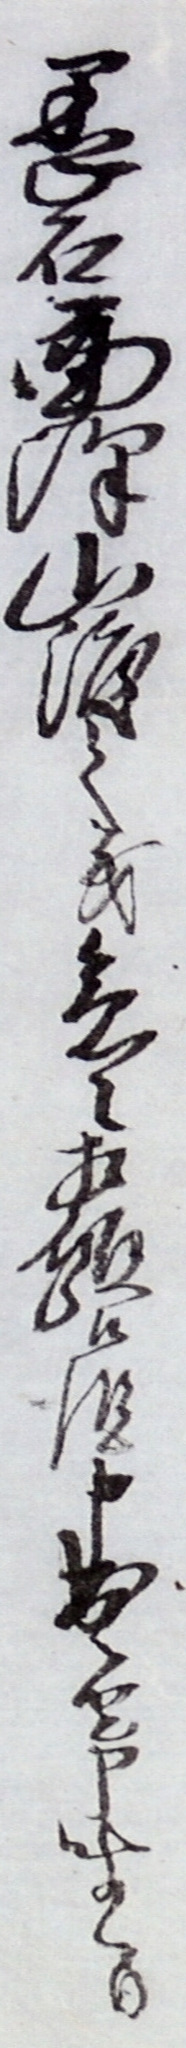黒石南澤山渡之義急々相願候段申出候由申聞候ニ付
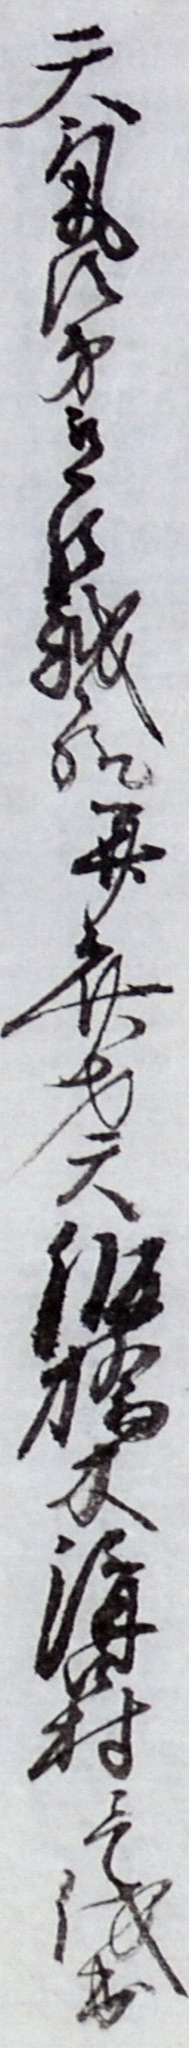天気次第被罷越候様并弁才天仮橋木溝口村ニて伐出
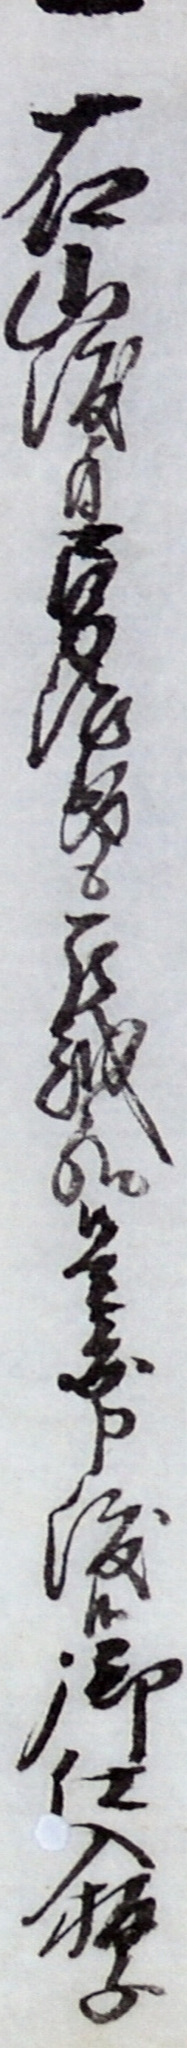一右山渡ニ付勇治義も罷越候様御差図申渡候御仕入板子
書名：御山奉行御用控
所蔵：伊那市立高遠町図書館・合同会社AMANE
